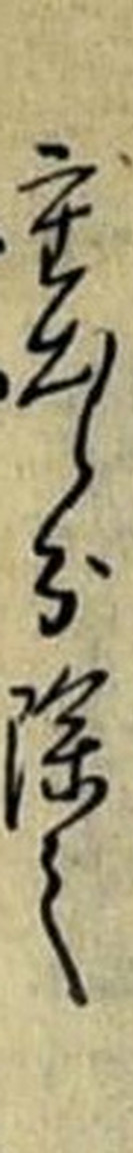重出之分除之
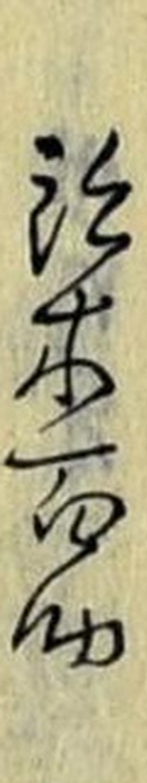鈴木百助
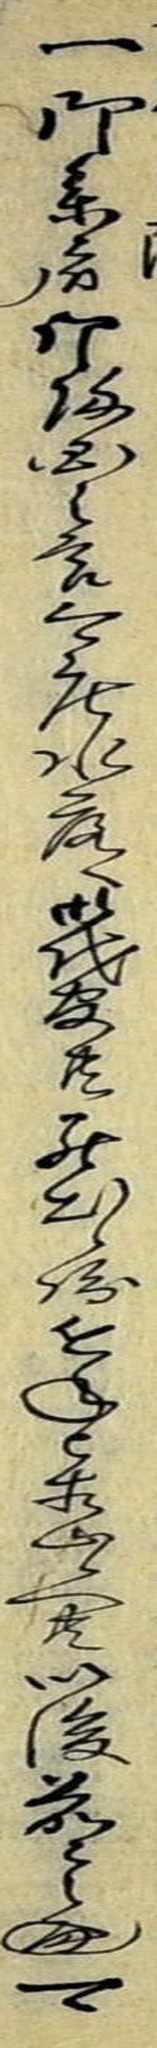一御参府御帰国之節今庄水落へ御代官共罷出候儀近年被相止候へ共以後前々之通可
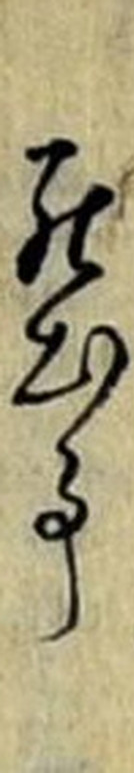罷出事
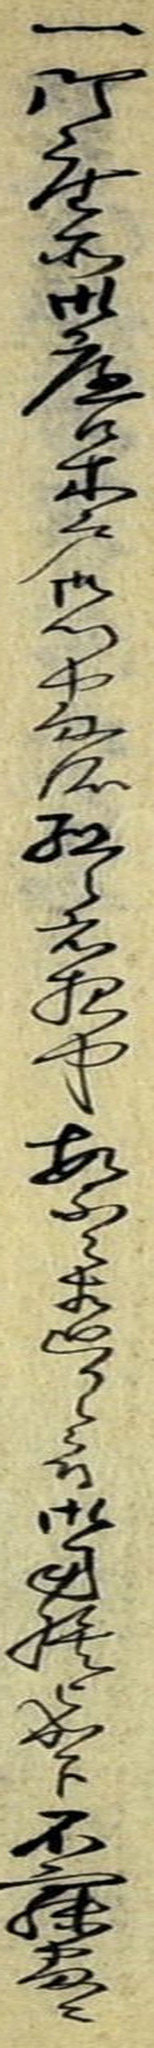一御座所御庭口木戸御門番所組之者夜中繁々相廻り候ニ付御用捨被成下不寝番ニ
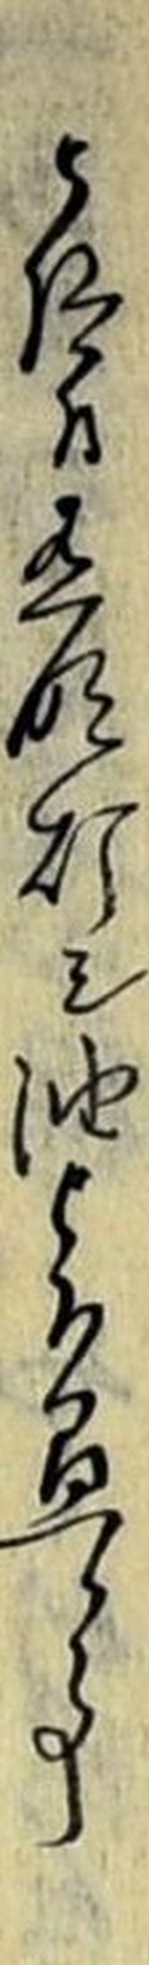被仰付有明灯シ油被下置候事
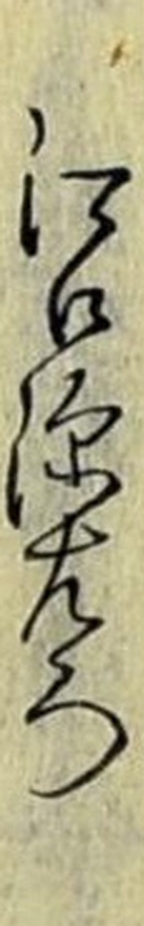江口源左衛門
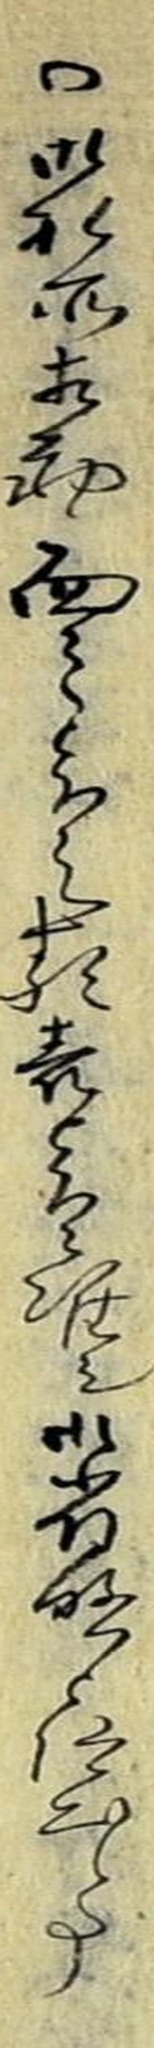〇御札所相勤候面々へ被下之類表被下ニ准シ御省略被仰出候事
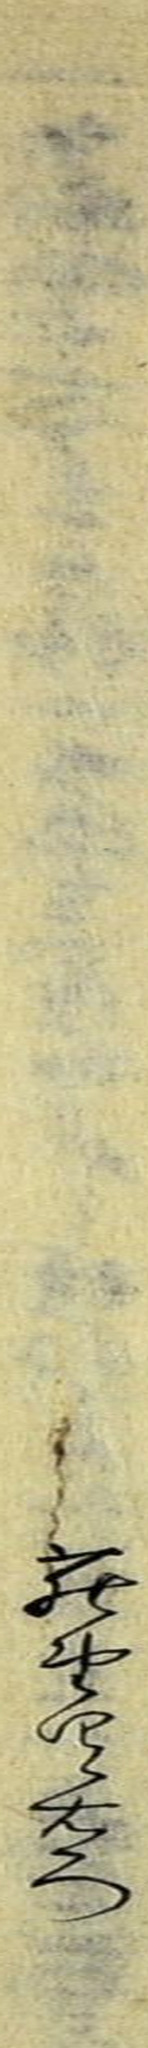荻野四郎右衛門
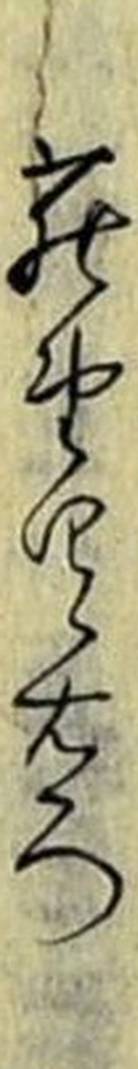荻野四郎右衛門
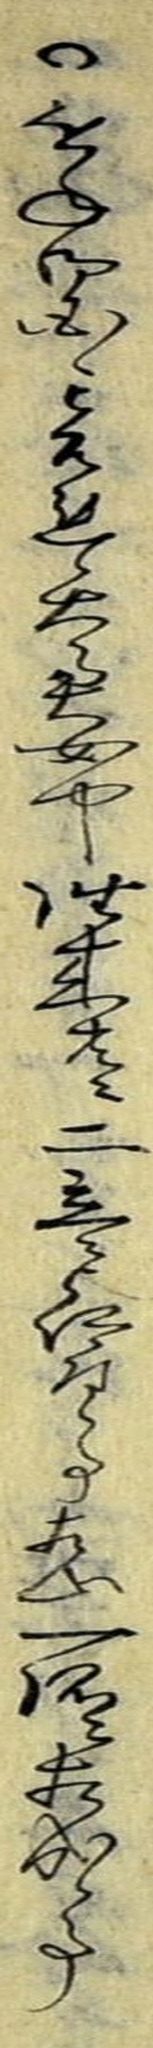〇近年御国へ被召連候大奥女中往来共ニ二立ニ被仰付候事相止一所ニ相成候事
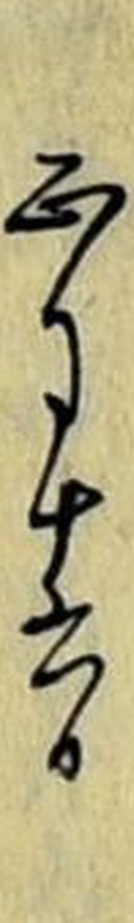正月十六日

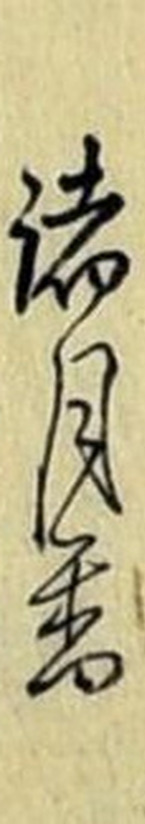諸月番
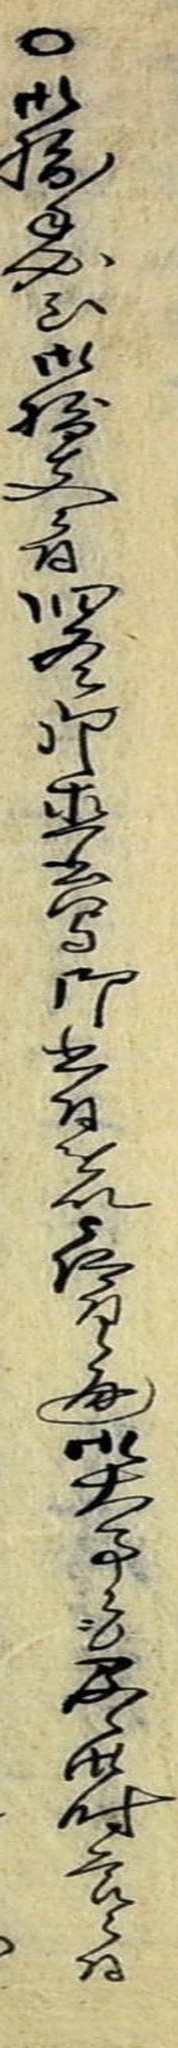〇御勝手必至御指支ニ付旧冬御直書写御書付を以被仰付候通御大事ニも及候御時節ニ付
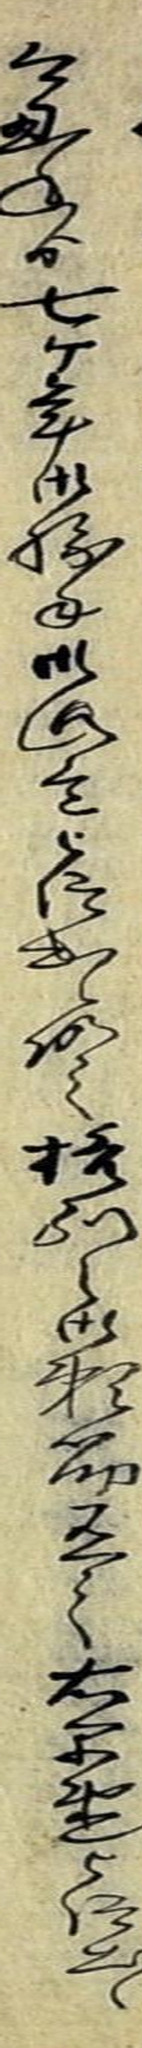今丑年ゟ七ケ年御勝手御趣意被仰出候仍之格別之御頼筋有之右早速被仰出候
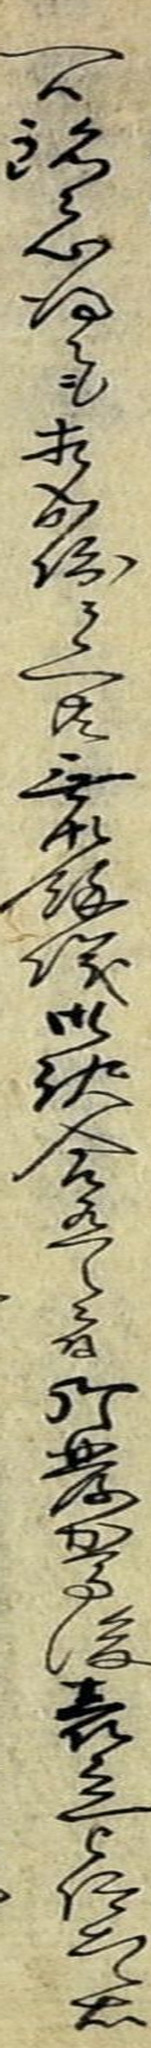ヘハ銘々心得ニも相成儀ニ候ヘ共無御余儀御訳合有之ニ付御発駕後表立被仰出候右
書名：命令之部 三
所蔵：福井県文書館 Fukui Prefectural Archives
